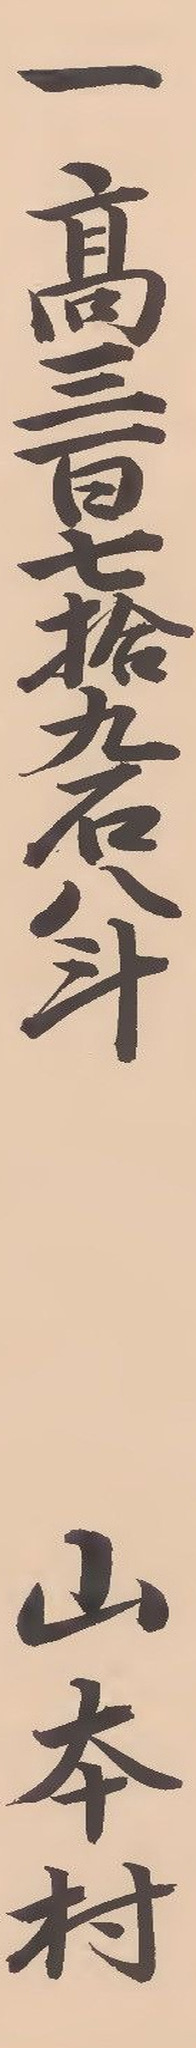一高三百七拾九石八斗山本村
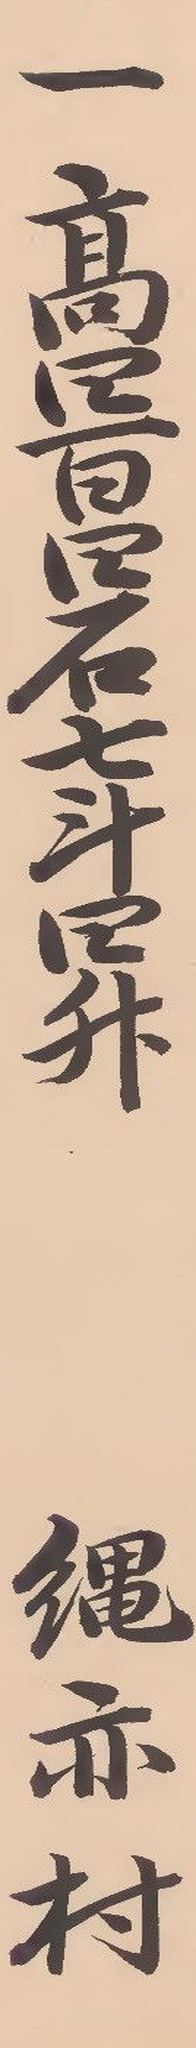一高四百四石七斗四升縄亦村
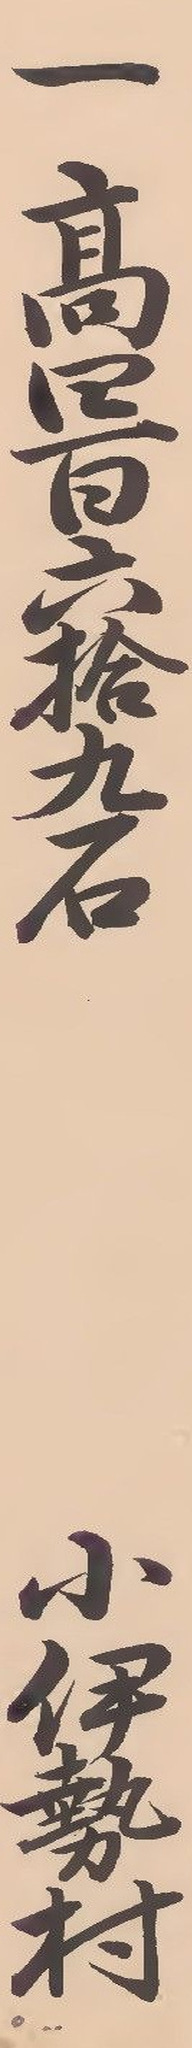一高四百六拾九石小伊勢村

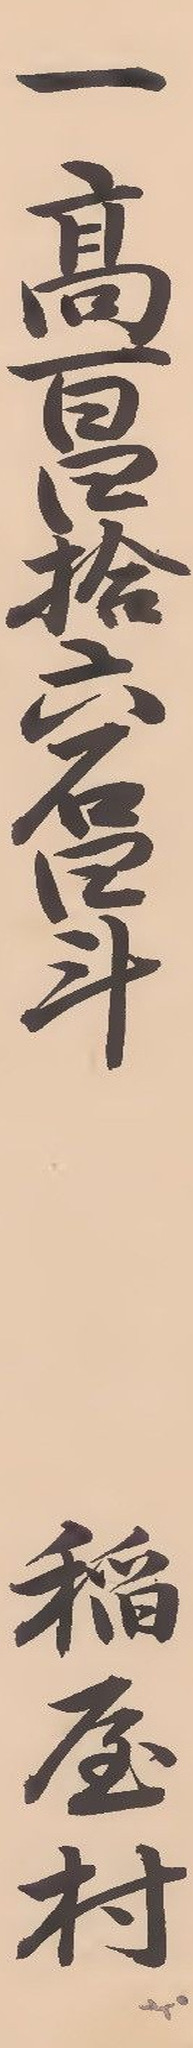一高百四拾六石四斗稲屋村
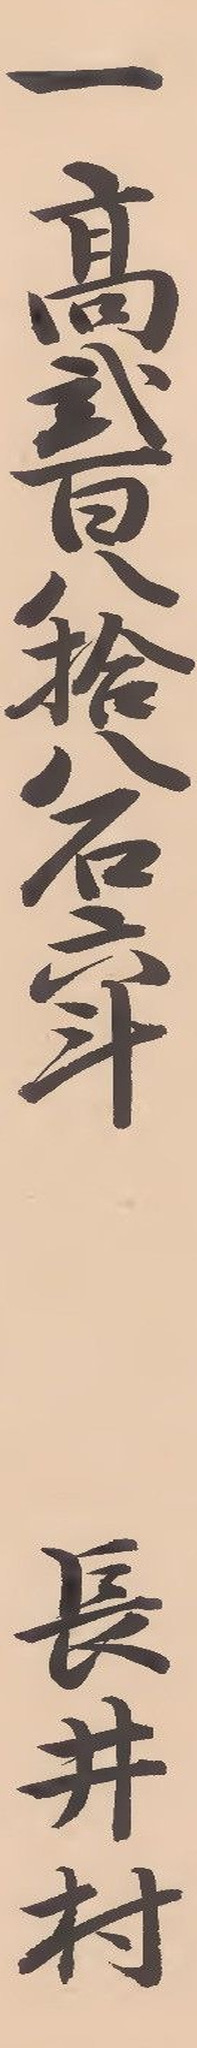一高弐百八拾八石六斗長井村
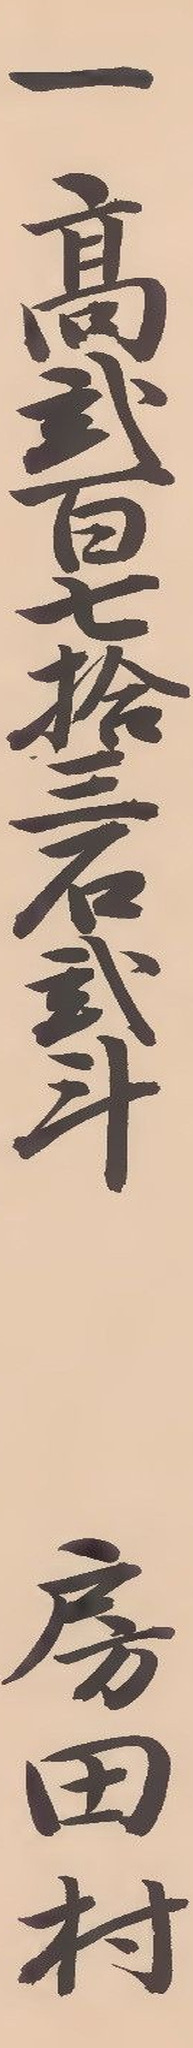一高弐百七拾三石弐斗房田村
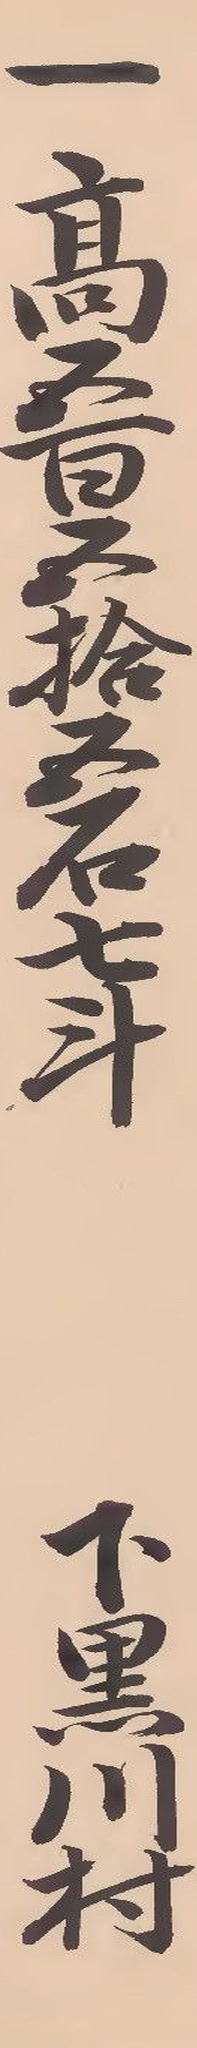一高五百五拾五石七斗下黒川村
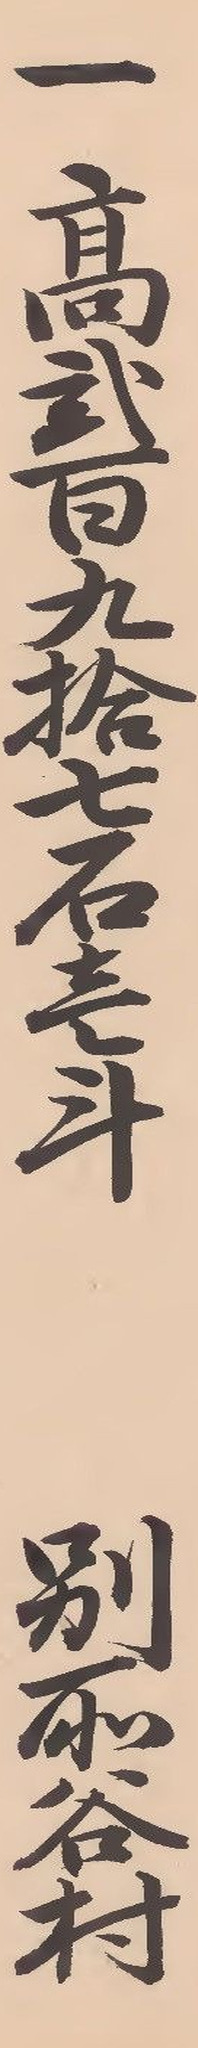一高弐百九拾七石壱斗別所谷村
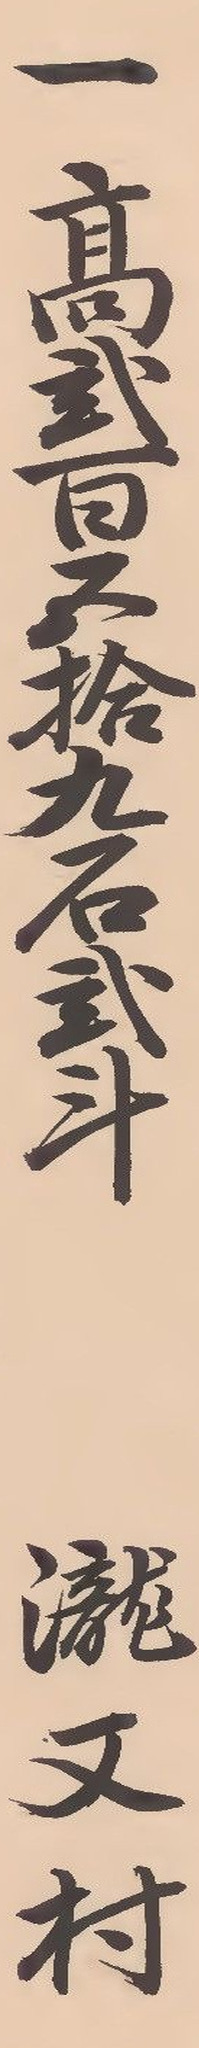一高弐百五拾九石弐斗滝又村
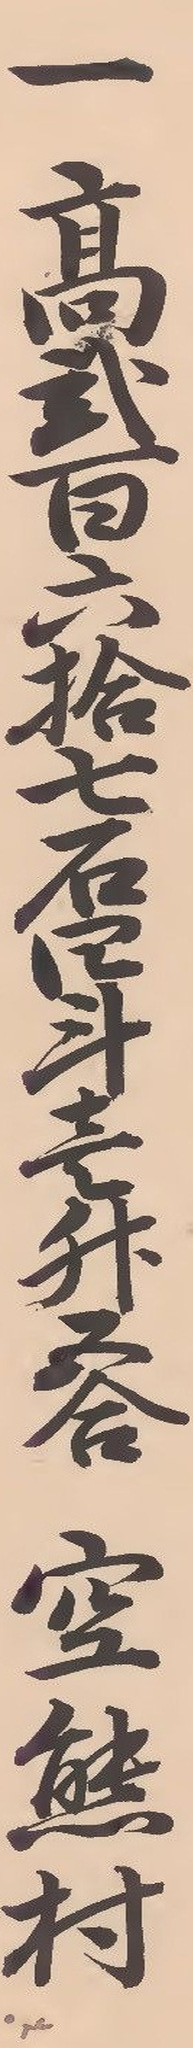一高弐百六拾七石四斗壱升五合空熊村

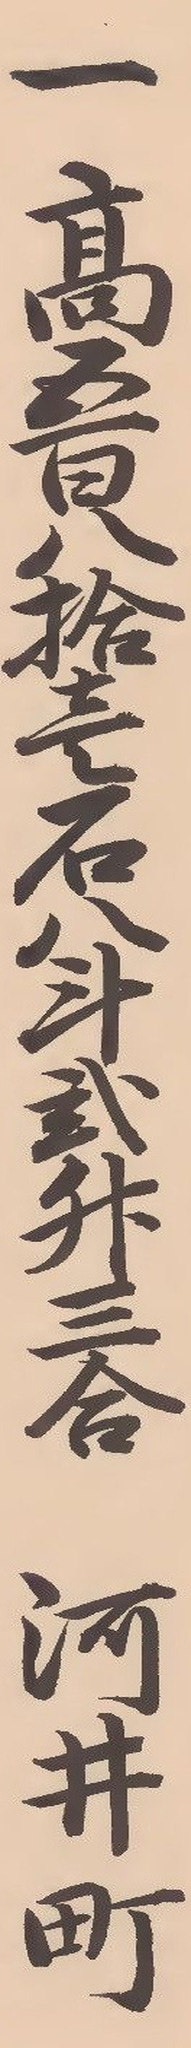一高五百八拾壱石八斗弐升三合河井町
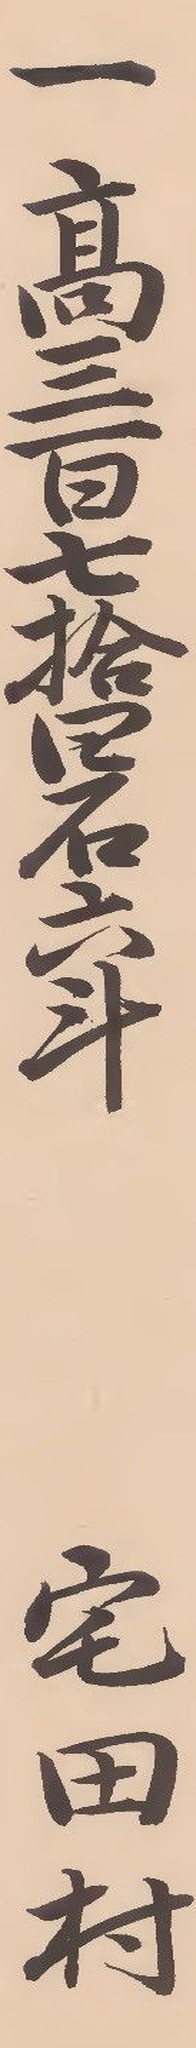一高三百七拾四石六斗宅田村
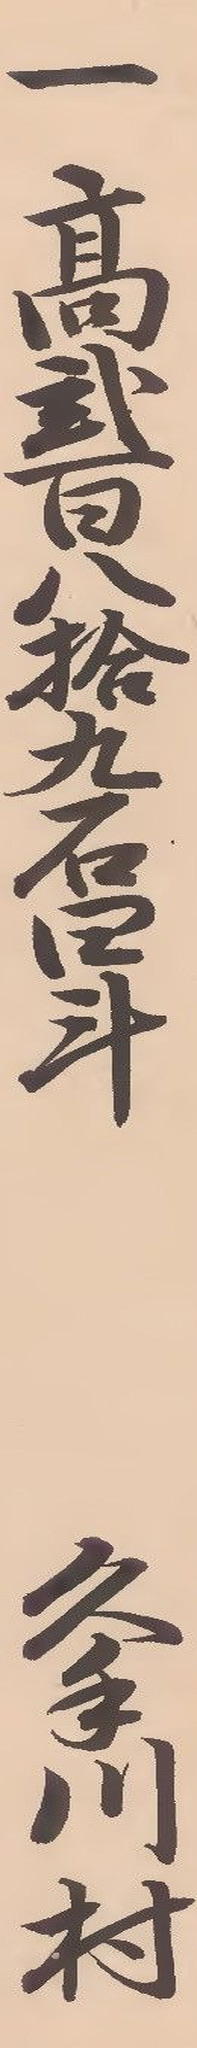一高弐百八拾九石四斗久手川村
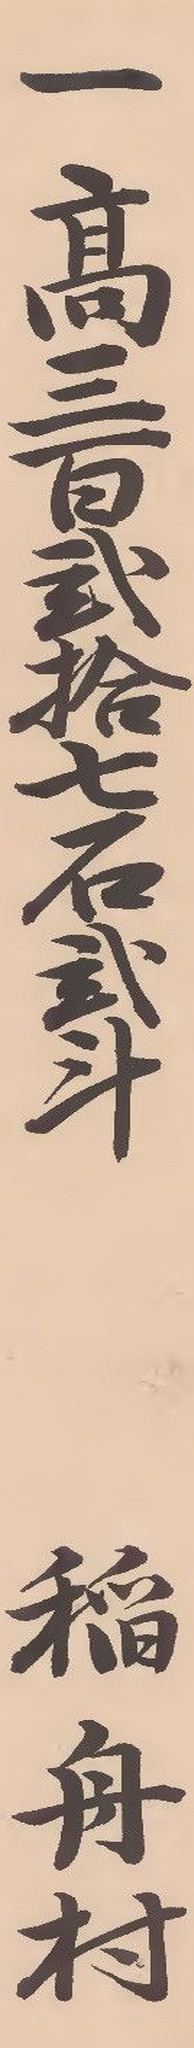一高三百弐拾七石弐斗稲舟村
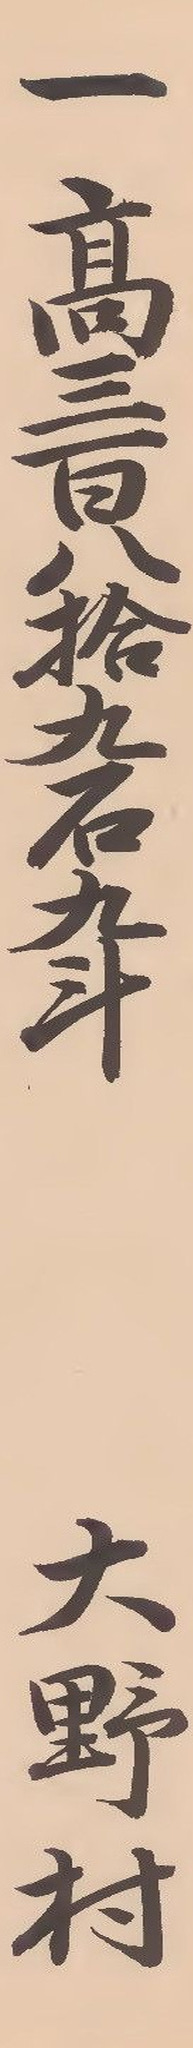一高三百八拾九石九斗大野村
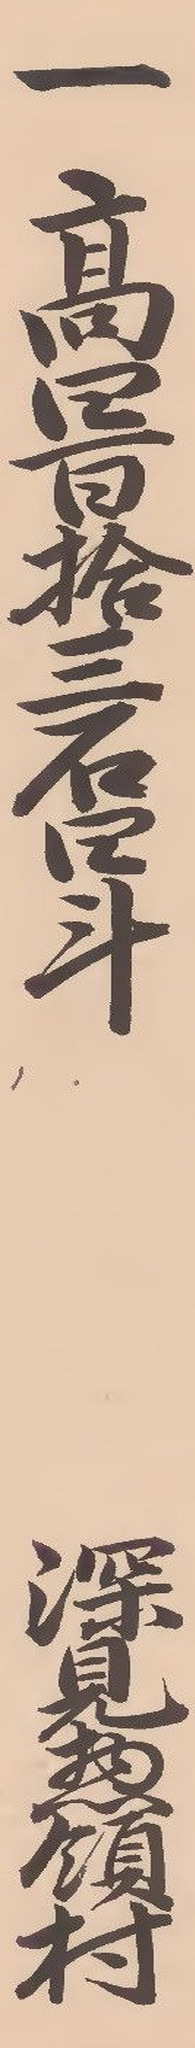一高四百拾三石四斗深見惣領村
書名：能登国郷帳
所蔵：国立公文書館 National Archives of Japan
